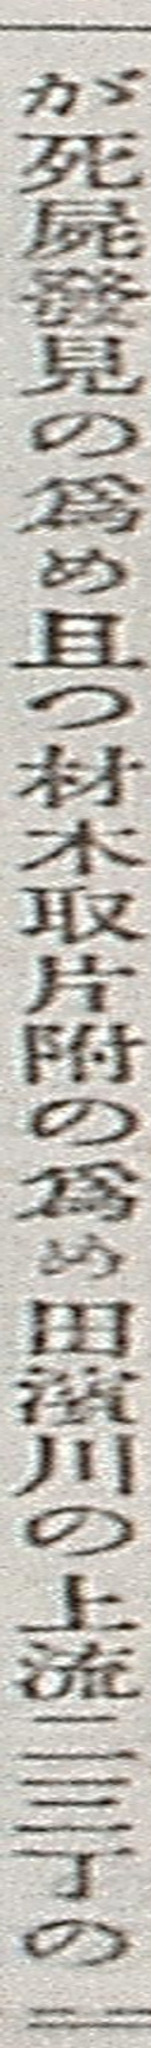が死屍発見の為め且つ材木取片付の為め田浜川の上流二三丁の

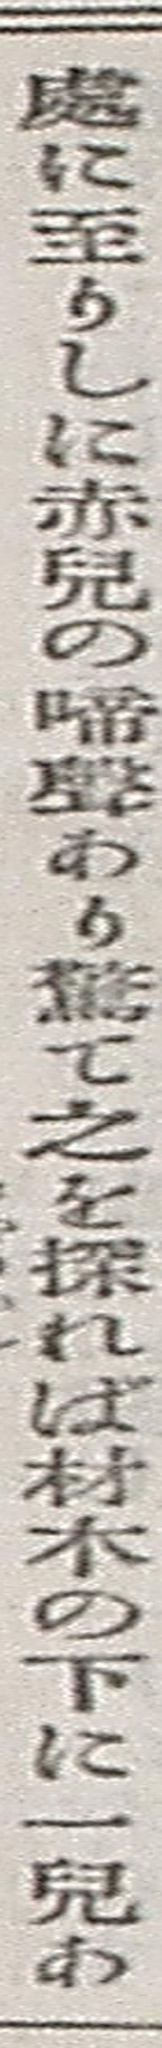処に至りしに赤兒の啼声あり驚て之を探れば材木の下に一兒あ
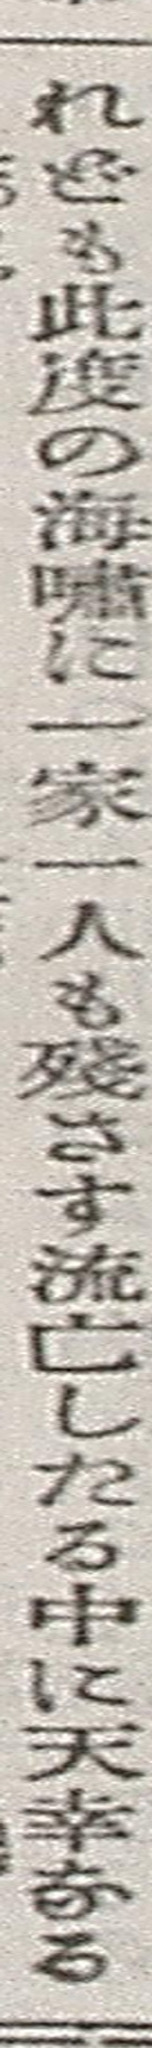れども此度の海嘯に一家一人も残さす流亡したる中に天幸なる
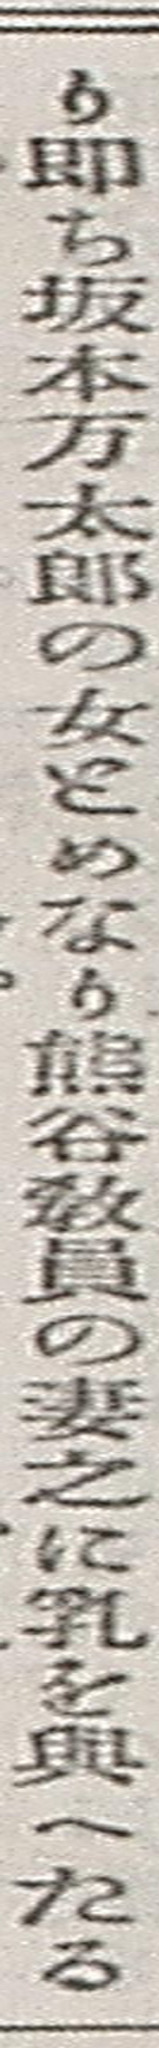り即ち坂本万太郎の女とめなり熊谷教員の妻之に乳を与へたる
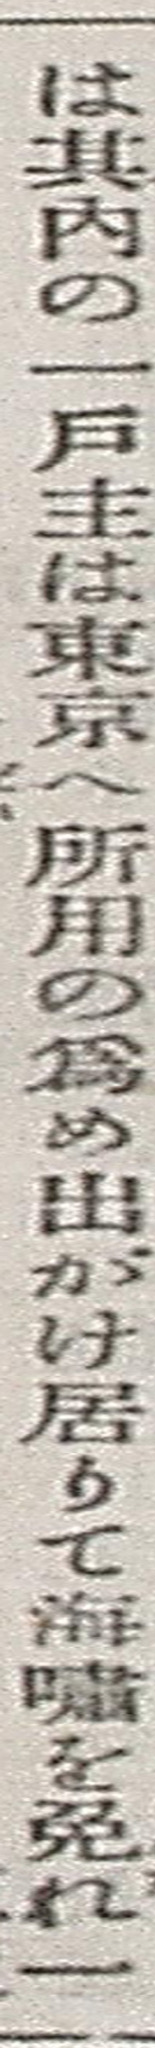は其内の一戸主は東京へ所用の為め出がけ居りて海嘯を免れ一
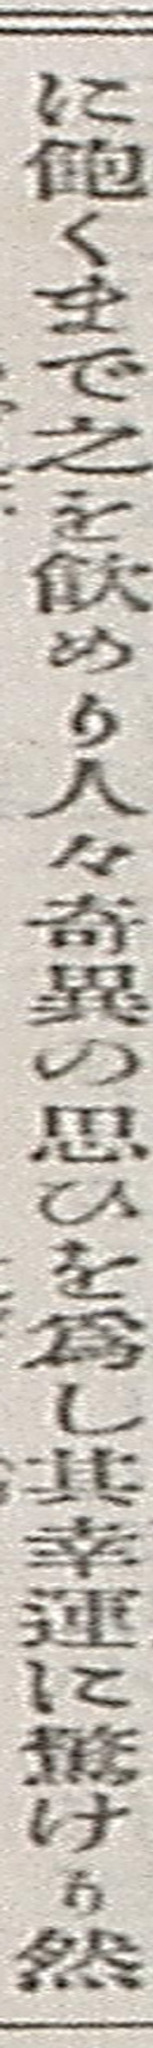に飽くまで之を飲めり人々奇異の思ひを為し其幸運に驚けり然
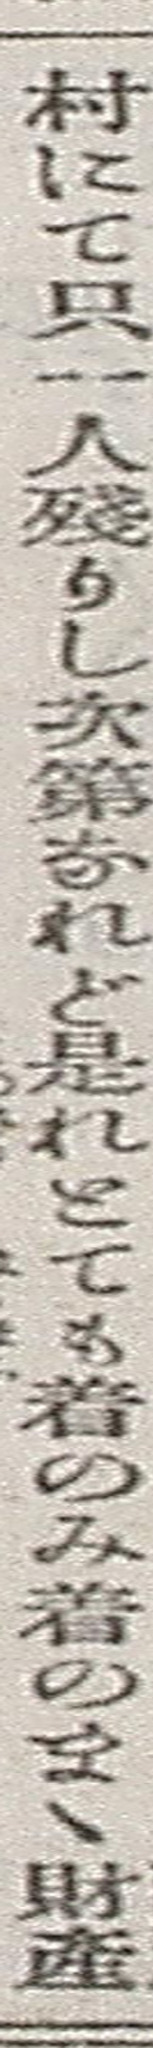村にて只一人残りし次第なれど是れとても着のみ着のまゝ財産
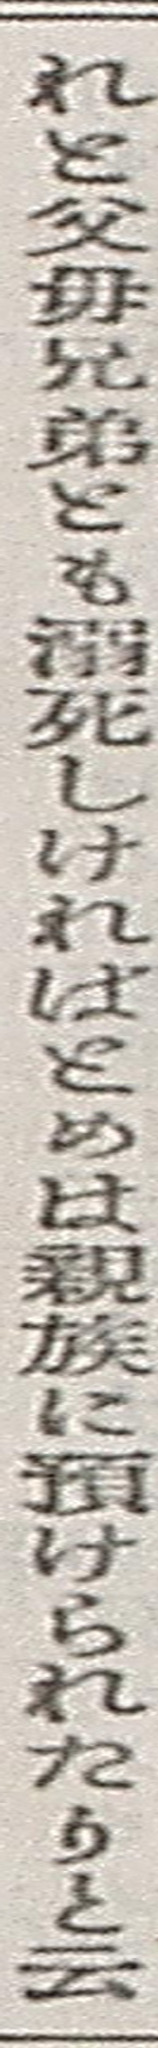れと父母兄弟とも溺死しければとめは親族に預けられたりと云
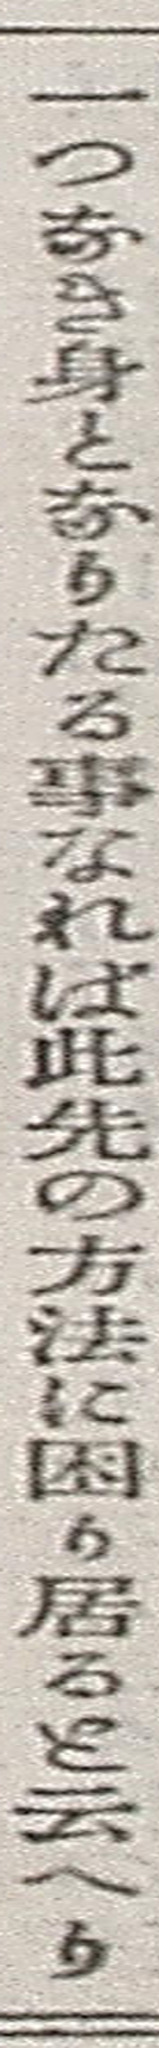一つなき身となりたる事なれば此先の方法に困り居ると云へり
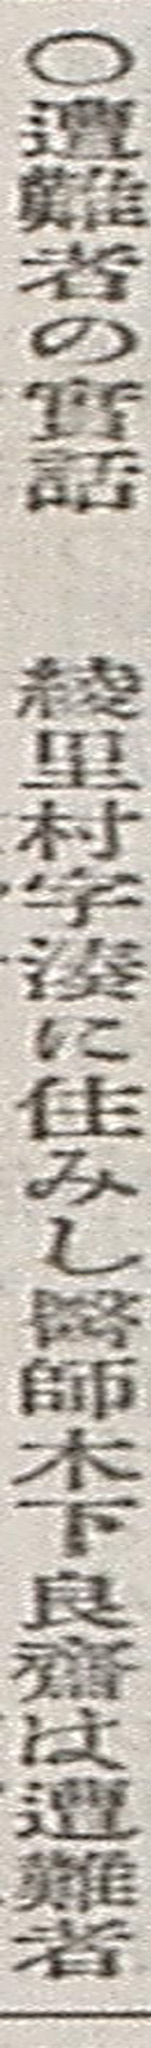○遭難者の実話綾里村字湊に住みし医師木下良斎は遭難者
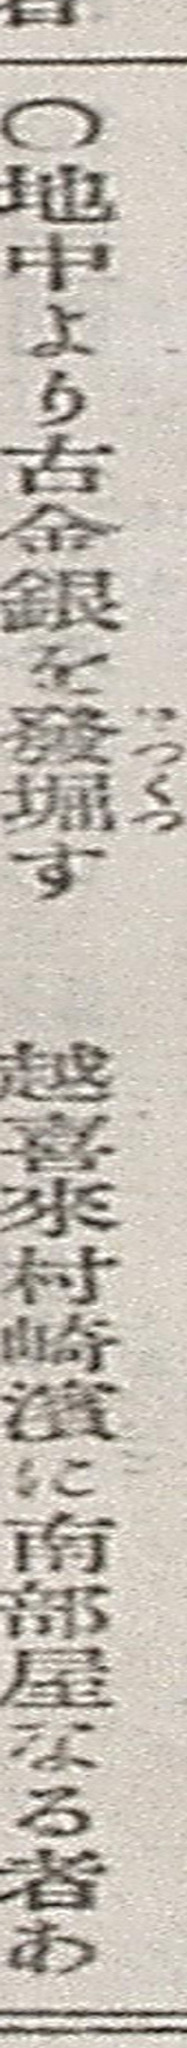○地中より古金銀を発掘す越喜来村崎浜に南部屋なる者あ
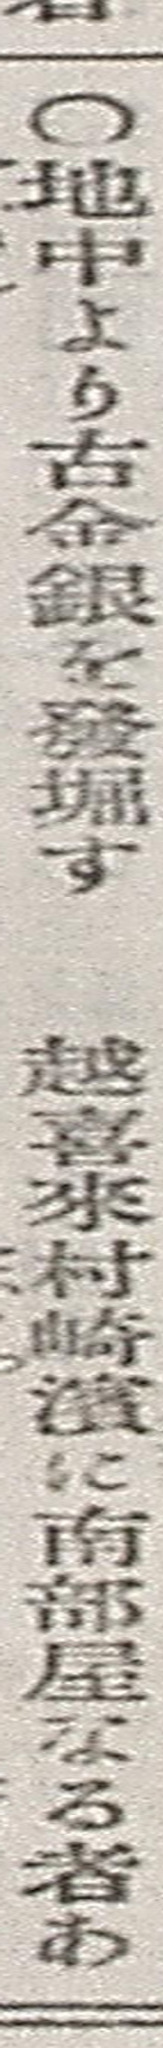○地中より古金銀を発掘す越喜来村崎浜に南部屋なる者あ
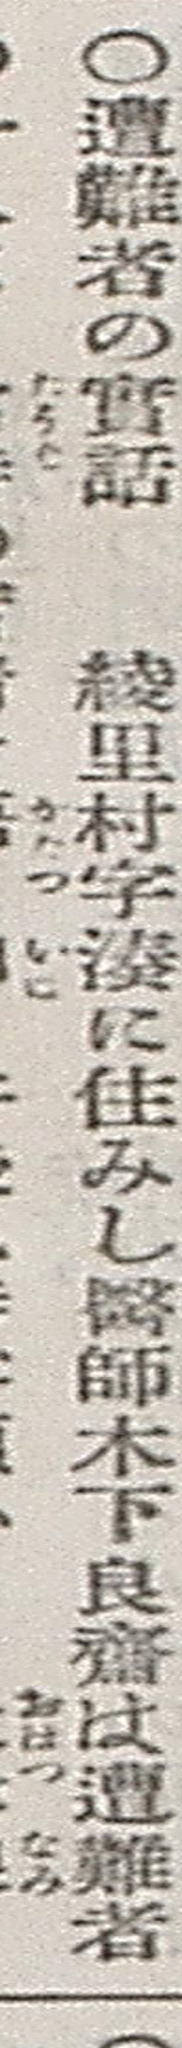○遭難者の実話綾里村字湊に住みし医師木下良斎は遭難者
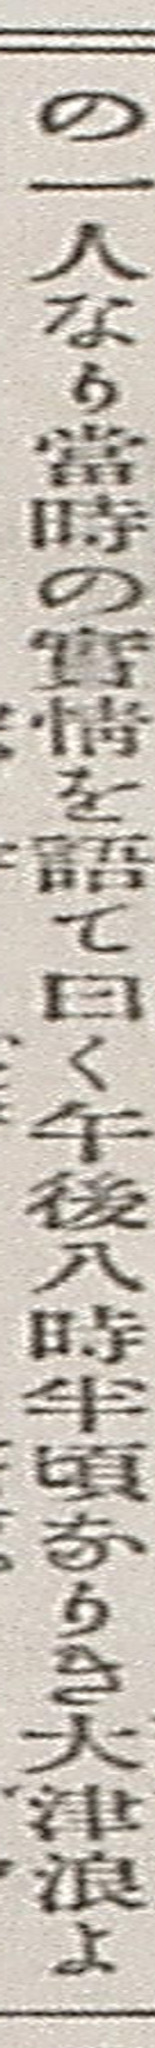の一人なり当時の実情を語て曰く午後八時半頃なりき大津浪よ
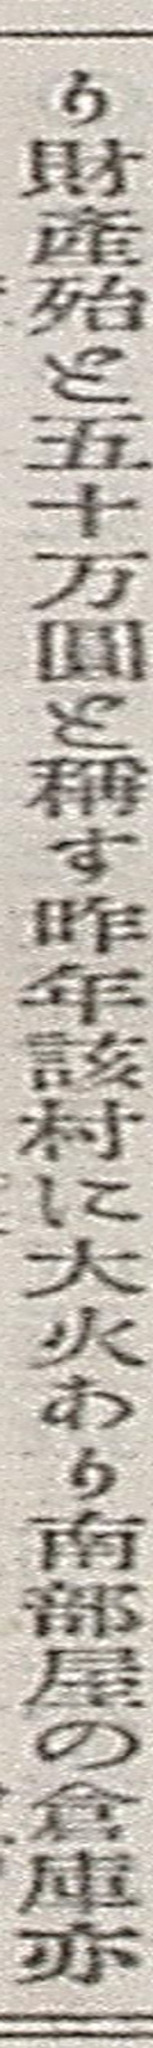り財産殆ど五十万円と称す昨年該村に大火あり南部屋の倉庫亦
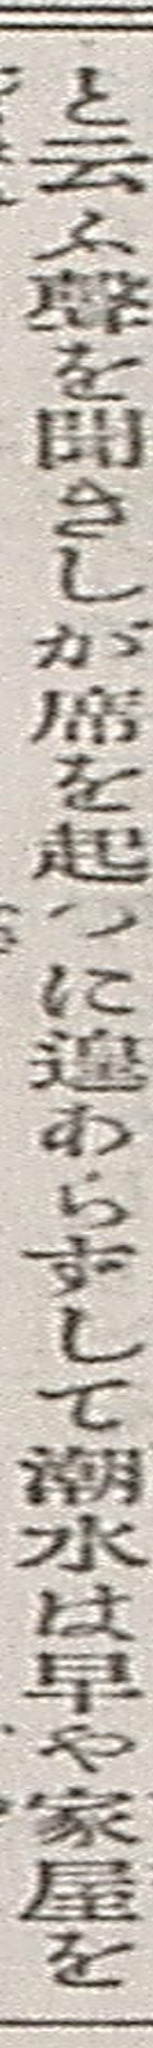と云ふ声を聞きしが席を起つに遑あらずして潮水は早や家屋を
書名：風俗畫報臨時増刊第百二十號　大海嘯被害録（下）
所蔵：東京大学地震研究所図書室 Earthquake Research Institute Library, The University of Tokyo, JAPAN
